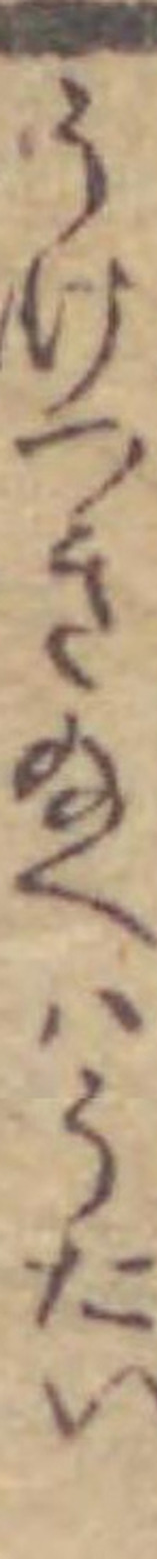うけつき給へはうたい
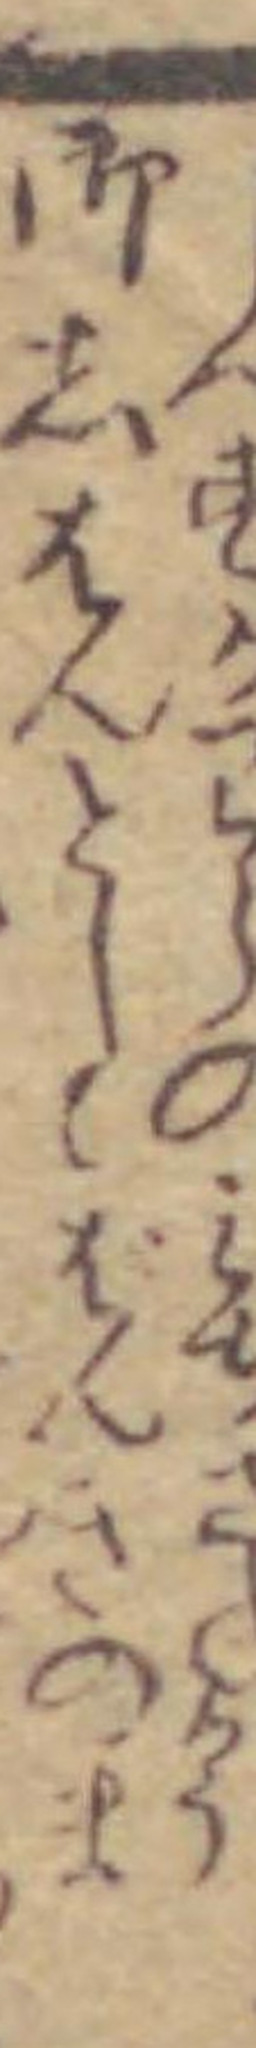御しはんとしてばんきのま
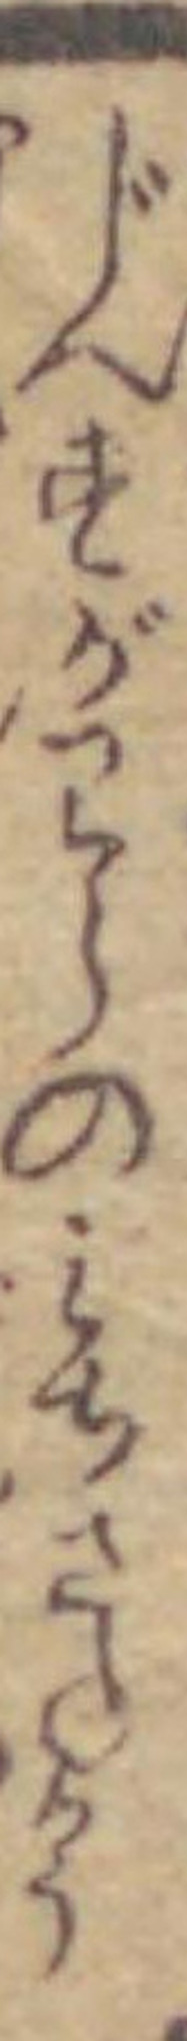じんすがわらのみちさねかう
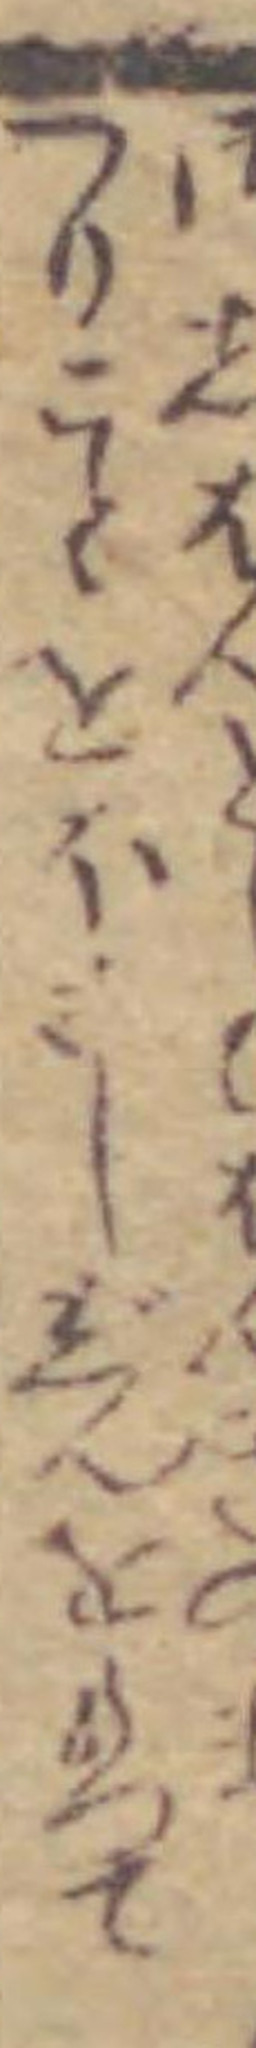つりことをほさしじんをもつて
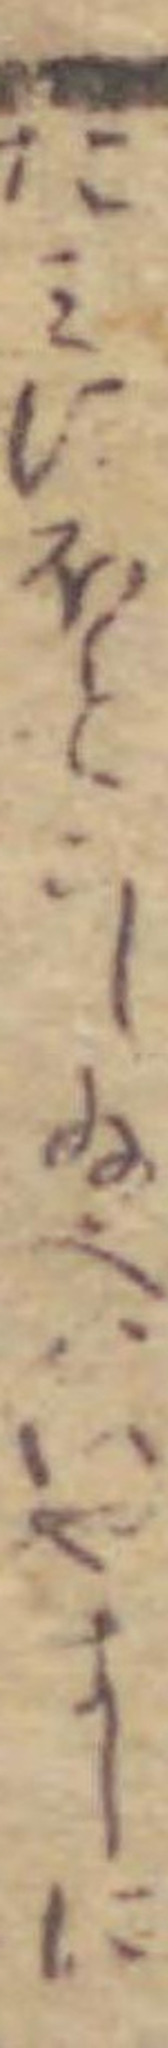たみにほとこし給へはいやましに
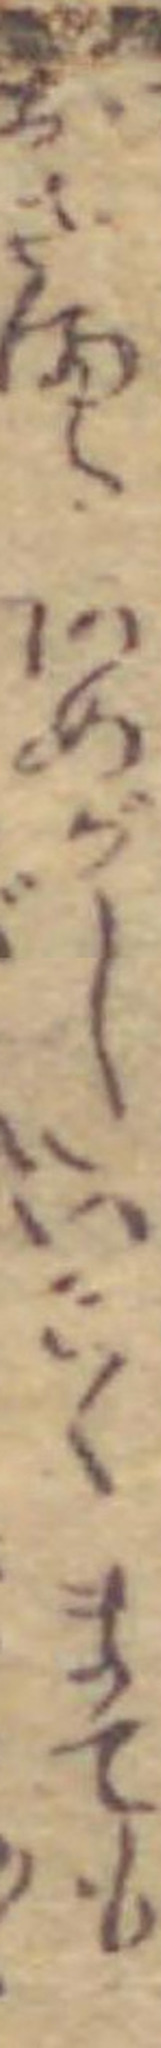おさまるあめがしたいこくまても
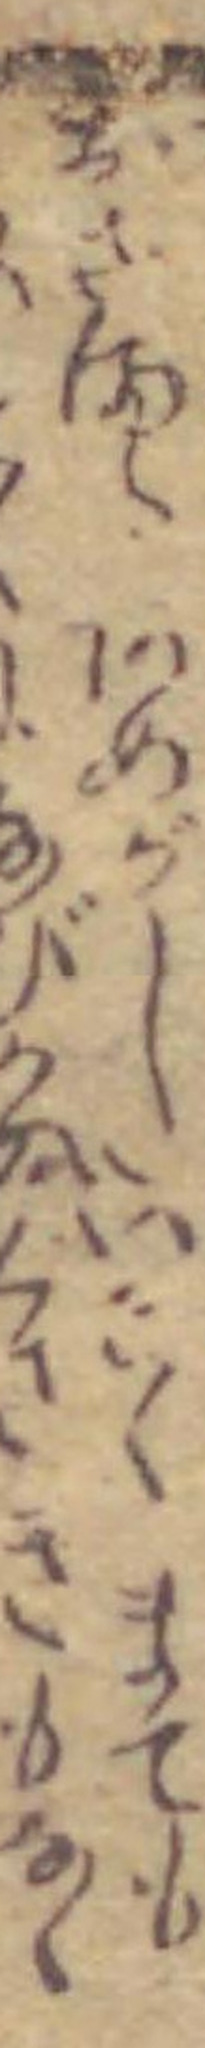そのとくになびかぬくさきもなく
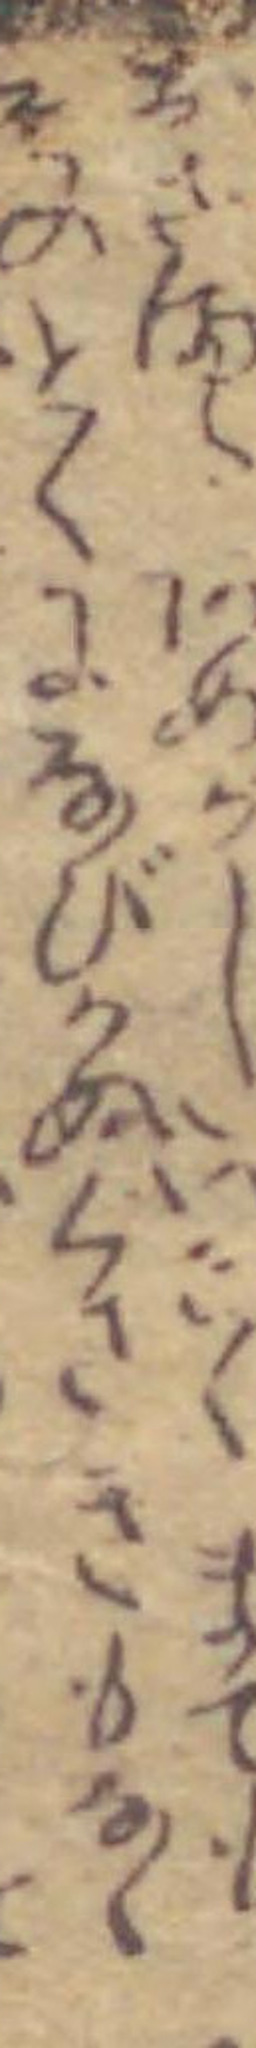そのとくになびかぬくさきもなく
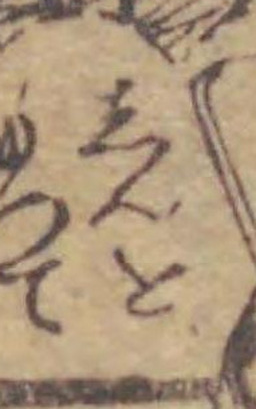しんを
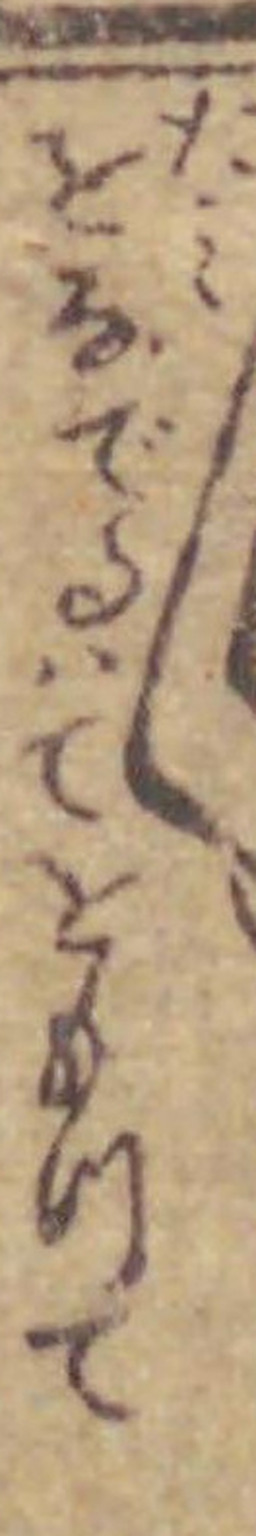をなでるはてをもつて
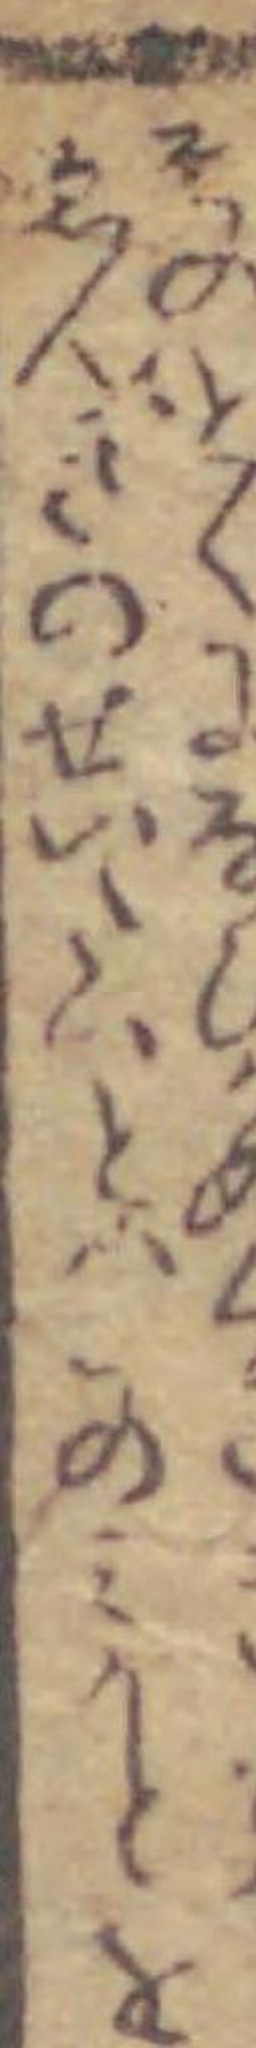ゑんぎのせいたいとはこのみかとを
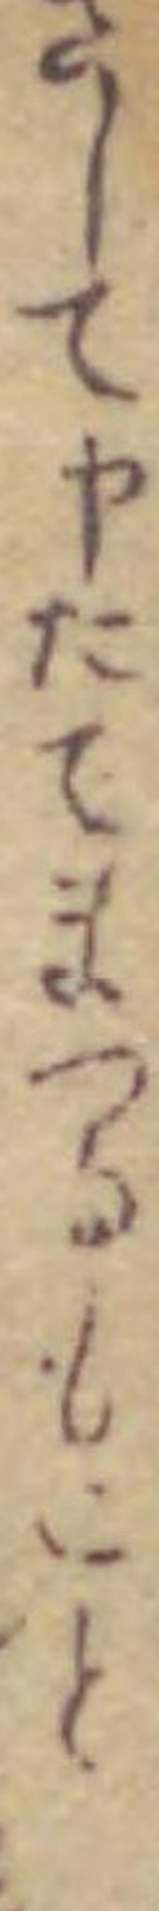さして申たてまつるもこと
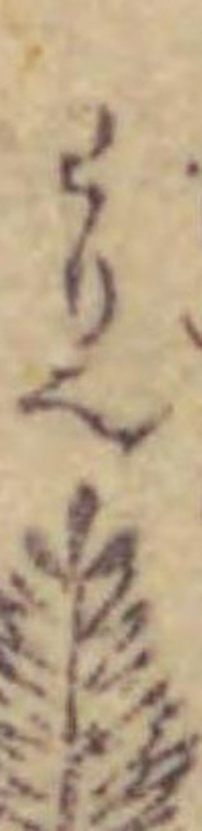わり也
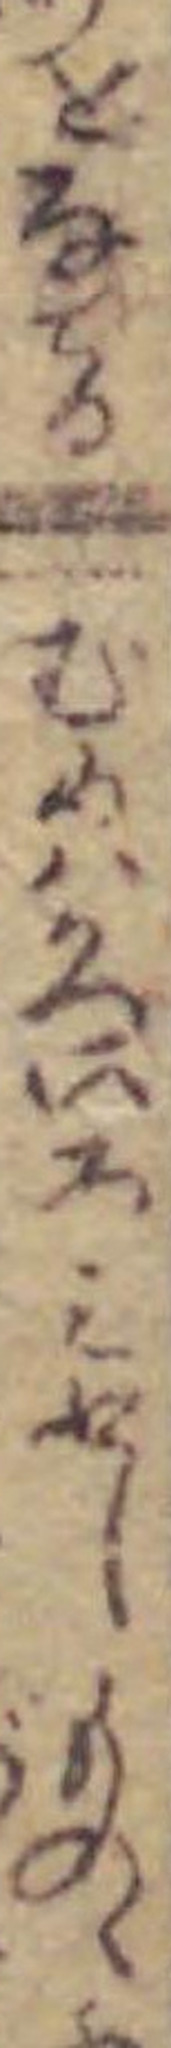むめはかついろみせしものゝふに
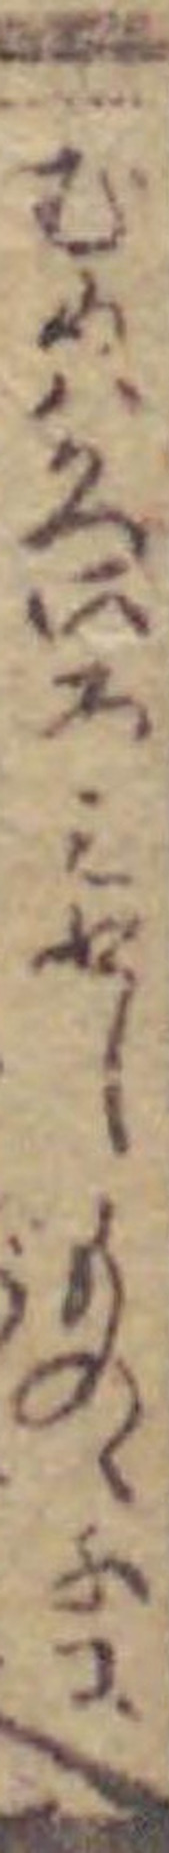むめはかついろみせしものゝふに
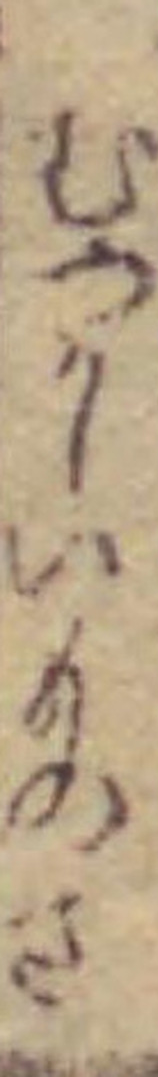むつかしいものさ
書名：天下一面鏡梅鉢 : 3巻
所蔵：国立国会図書館 National Diet Library, JAPAN
